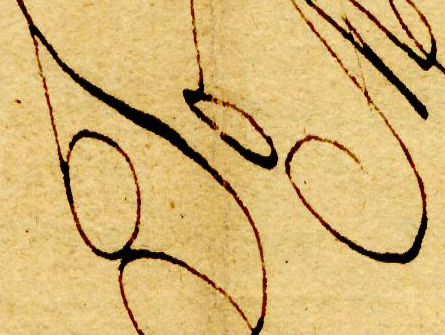To
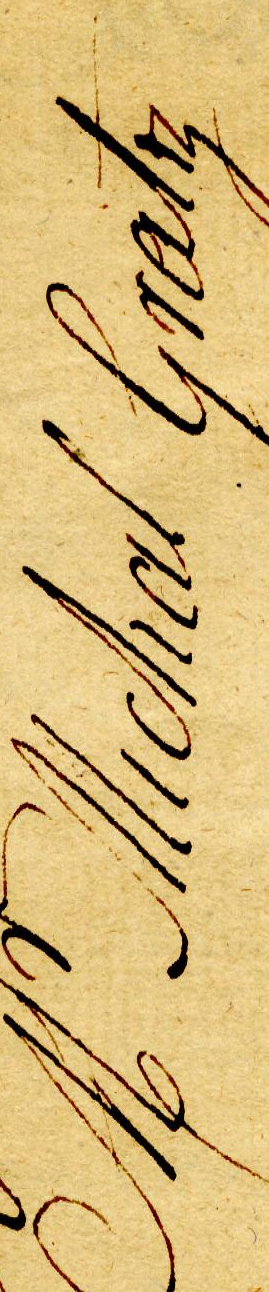M^r Michal Gratz
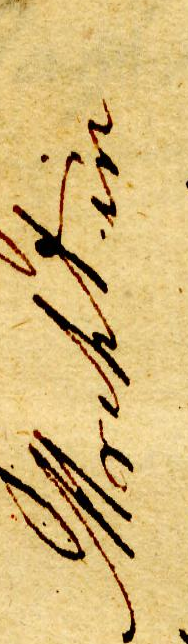Merch^t in
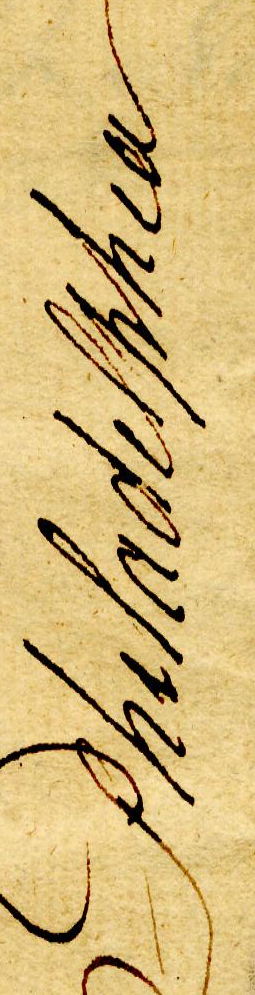Philadelphia
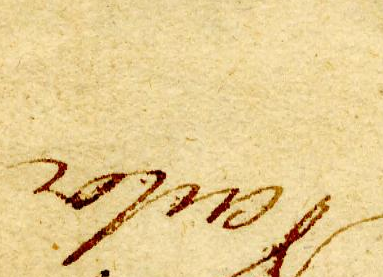Nailor
